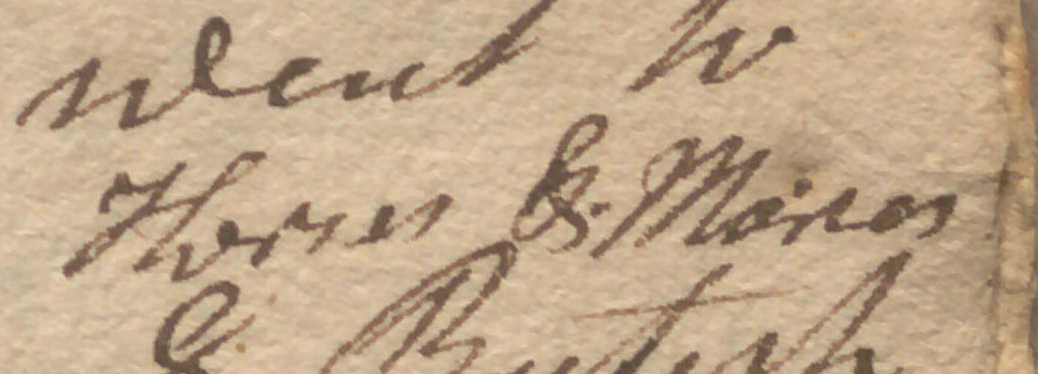Horses & Mares
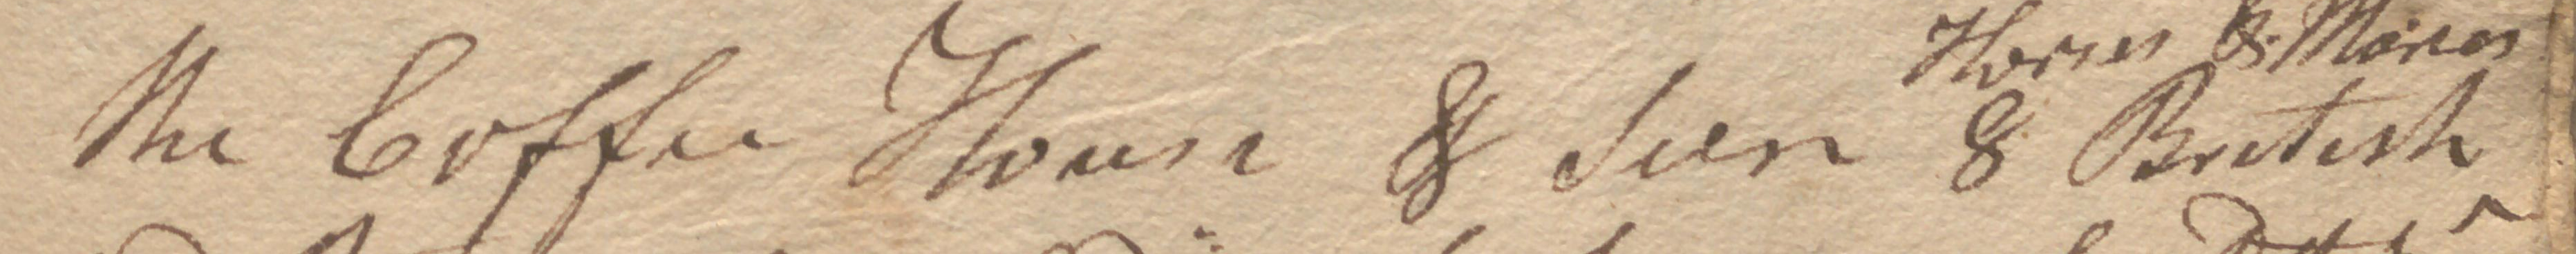the Coffee House & seen 8 British ^
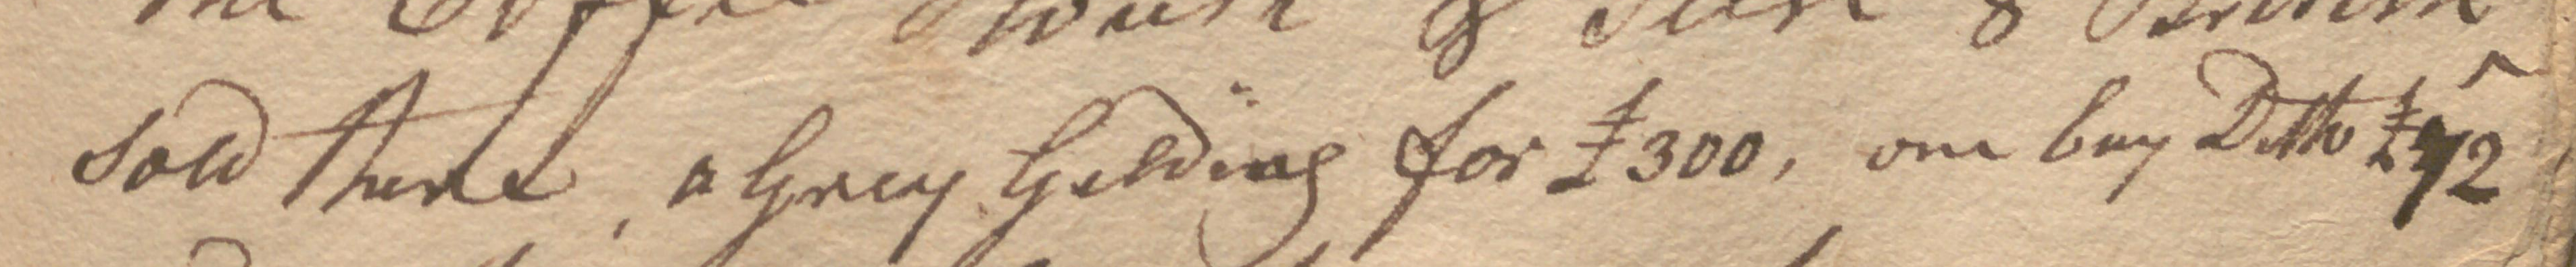sold there, a Grey Gelding for £300, one bay Ditto £72
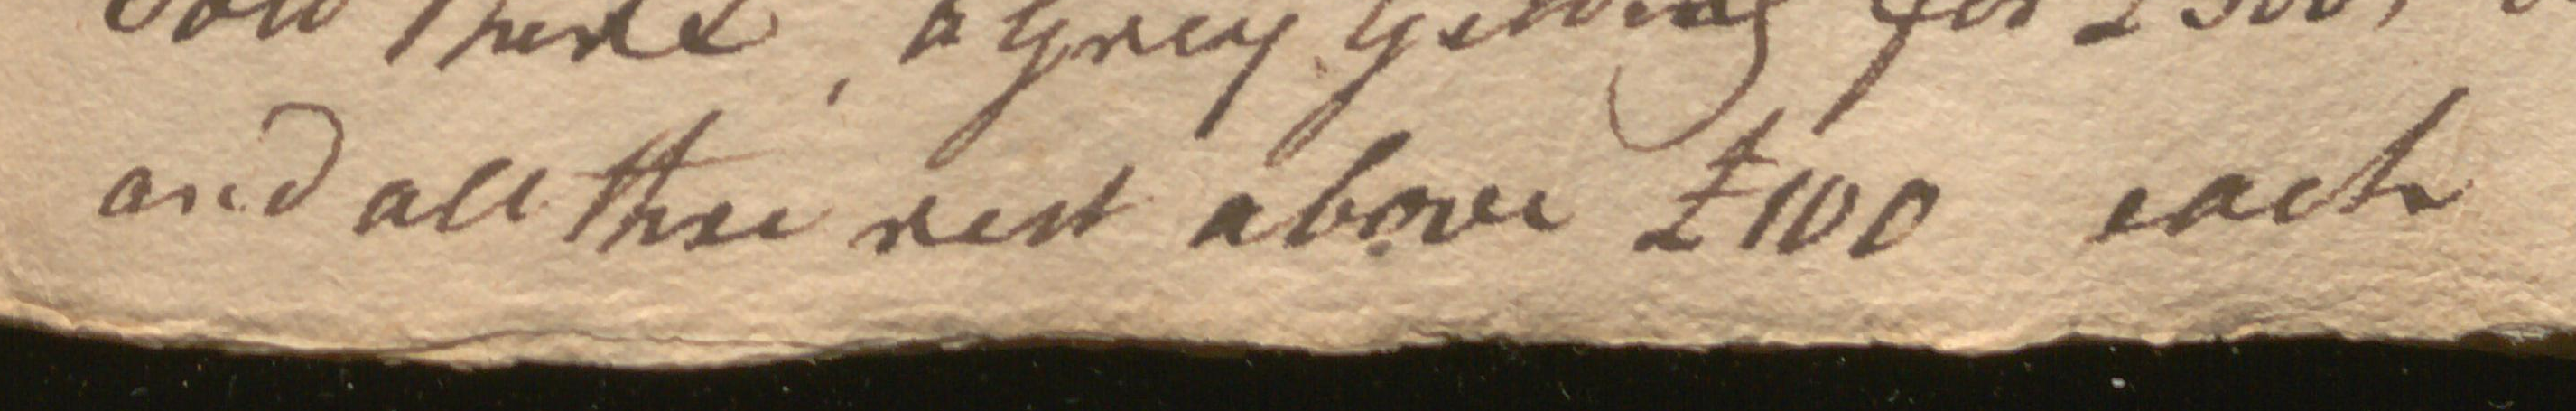and all thee rest above £100 each
